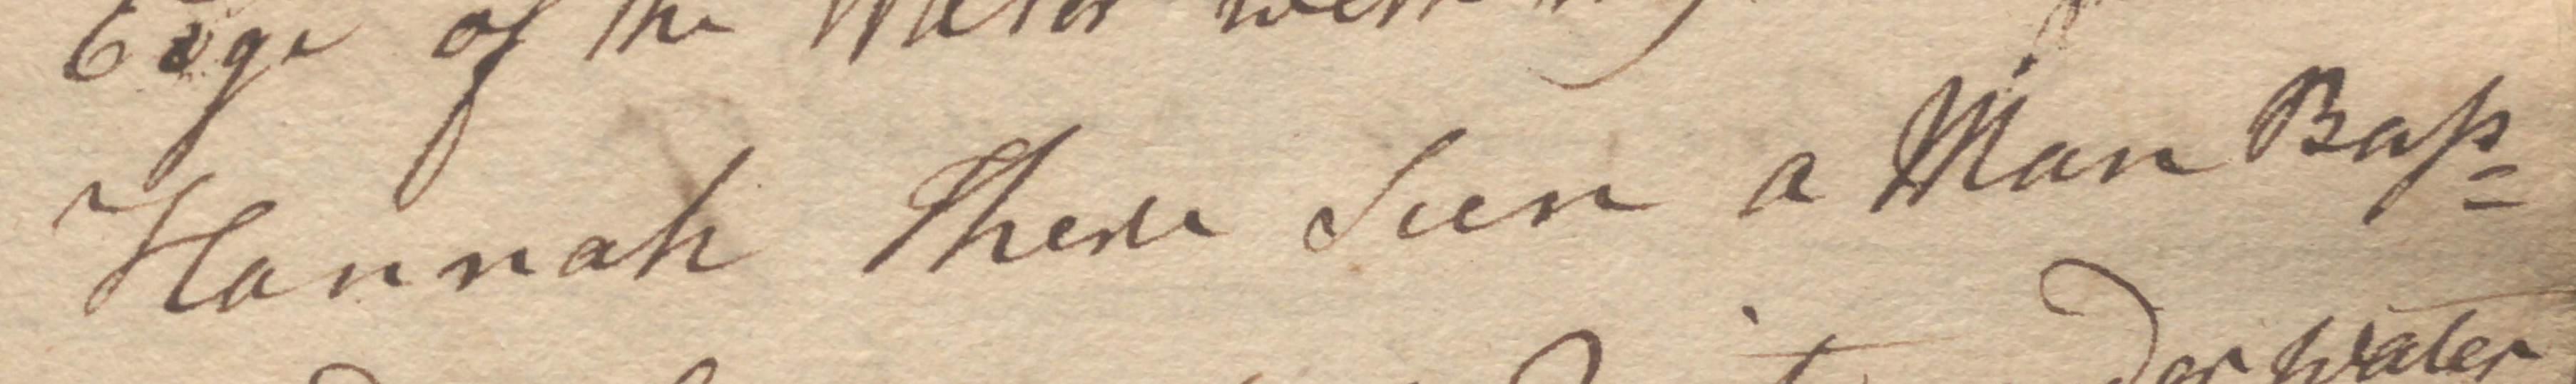Hannah There seen a Man Bap-
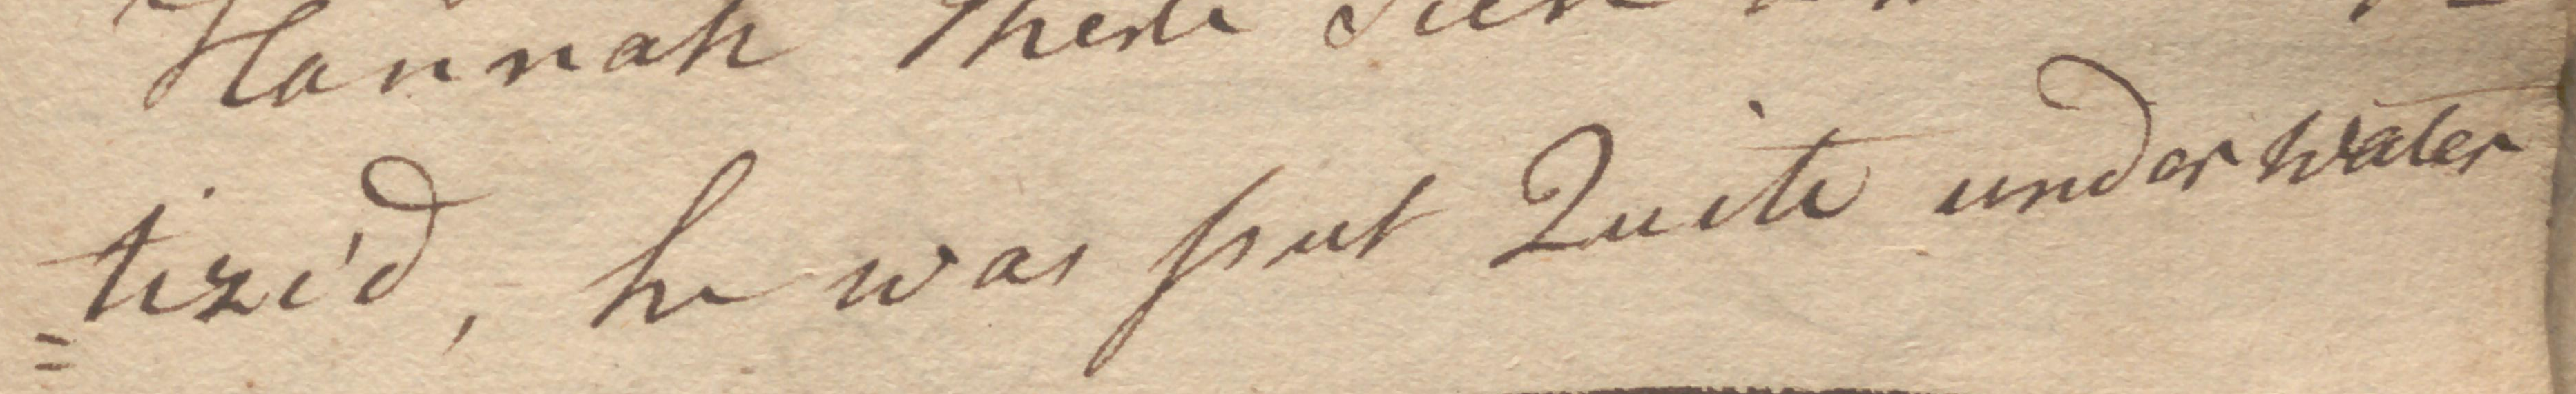-tize'd, he was put Quite under water
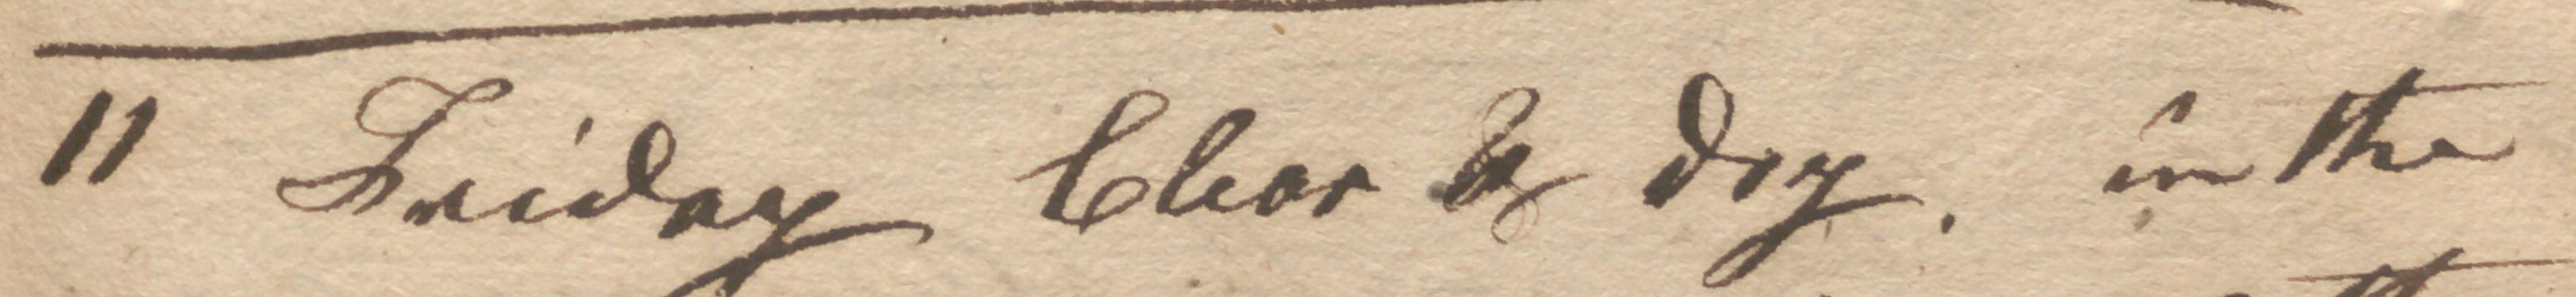11 Friday, Clear & dry in the
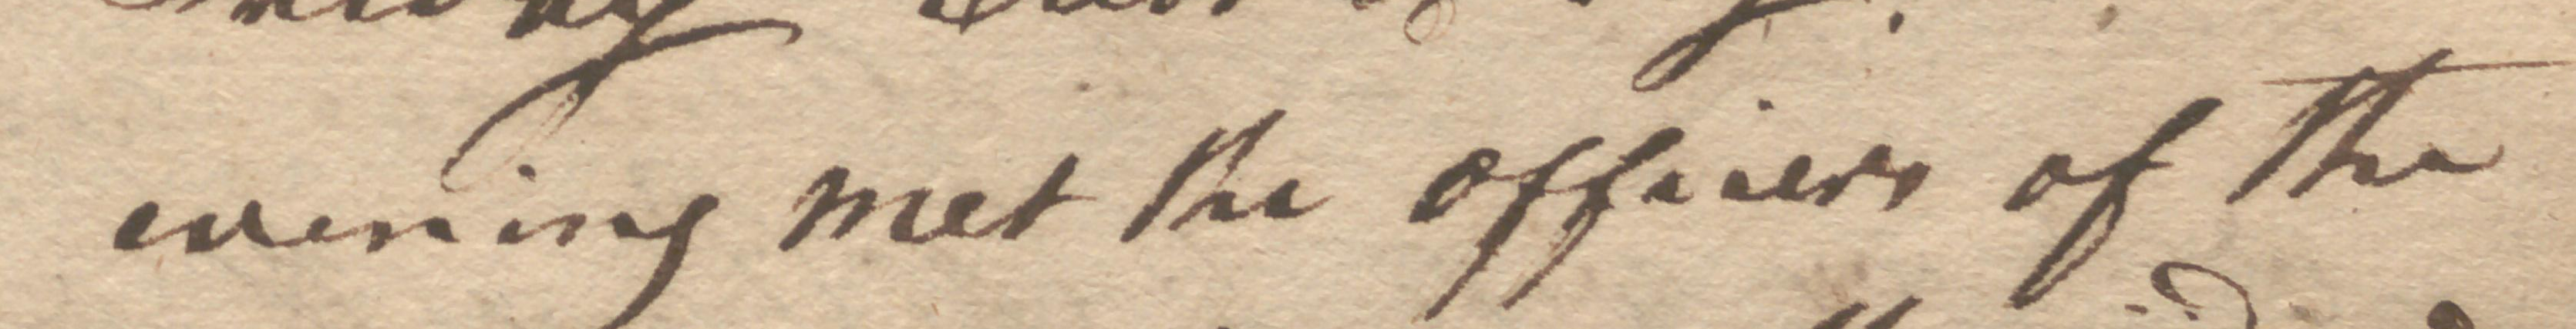evening met the officers of the
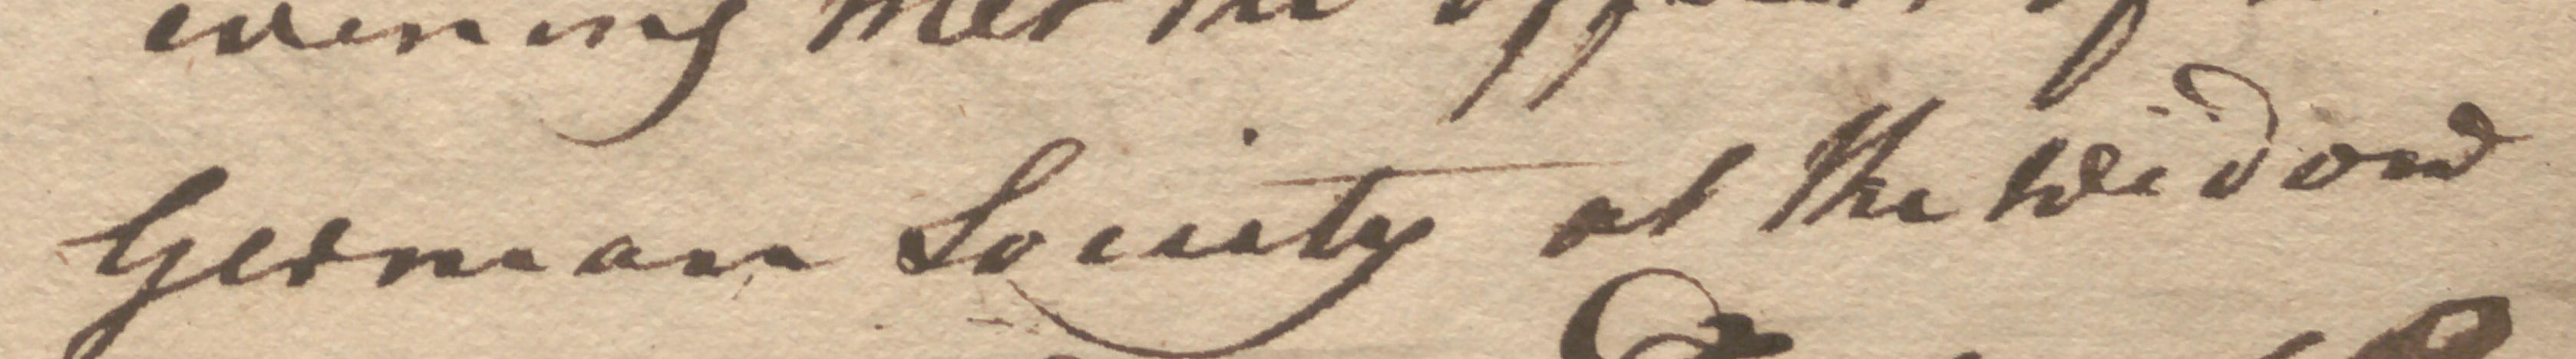German Society at the Widow
